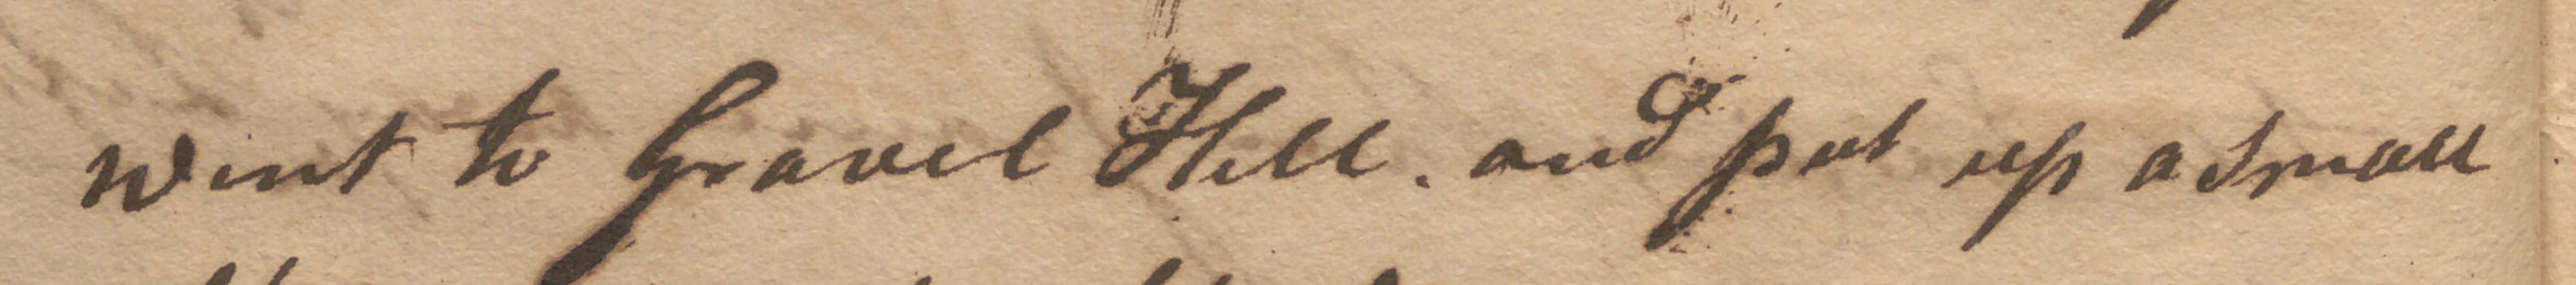went to Gravel Hill. and put up a small
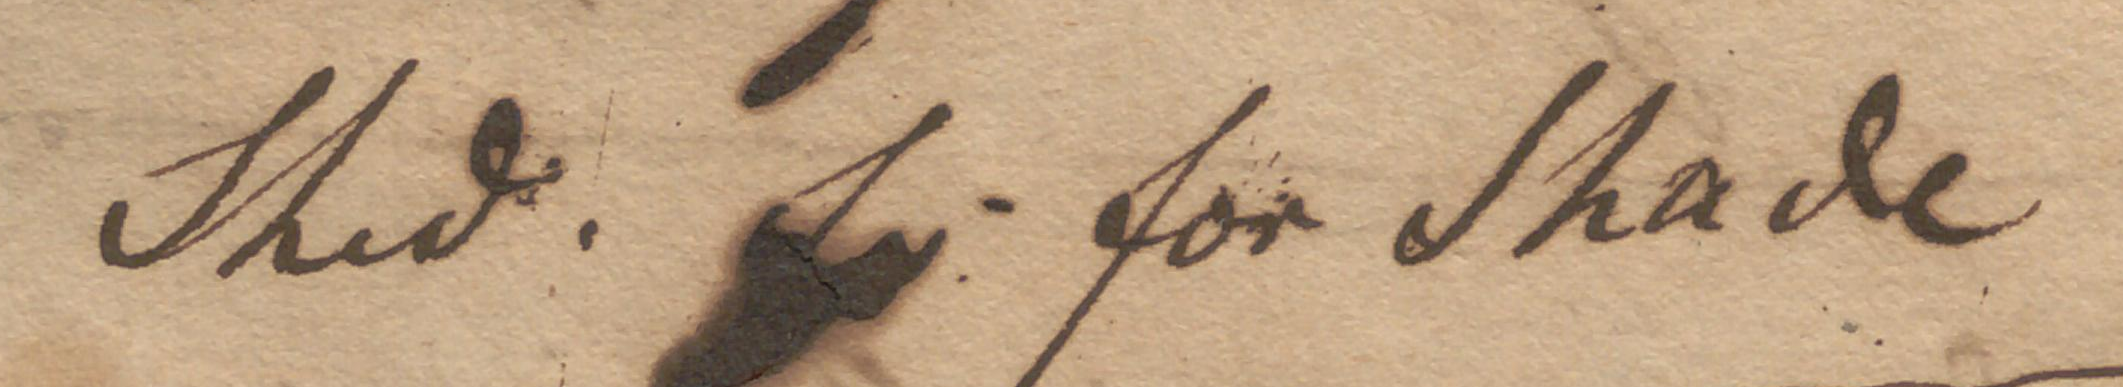Shed. [__] for Shade
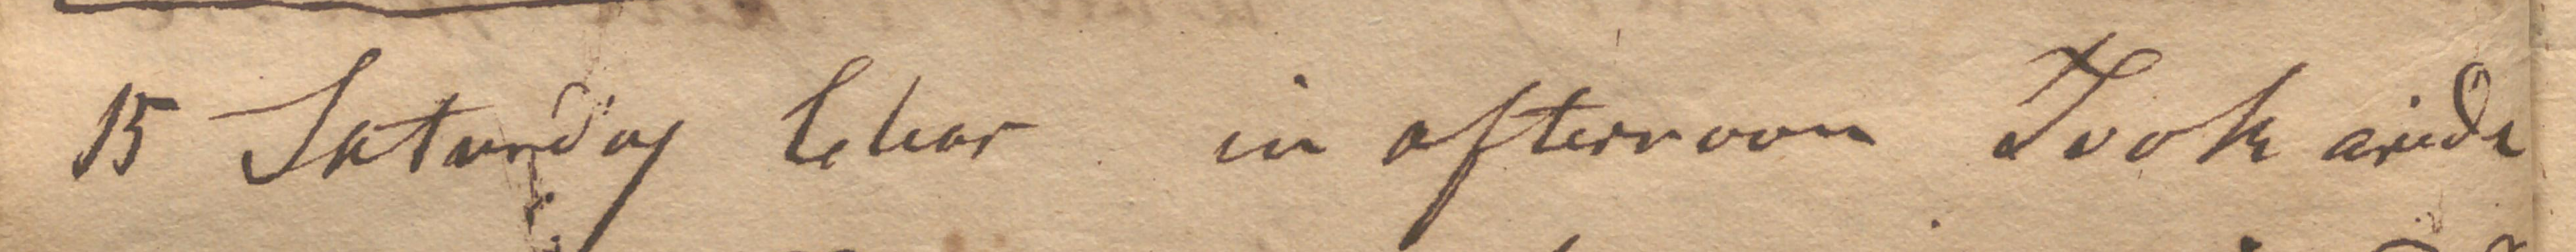15 Saturday Celear in aftermoon Took a ride
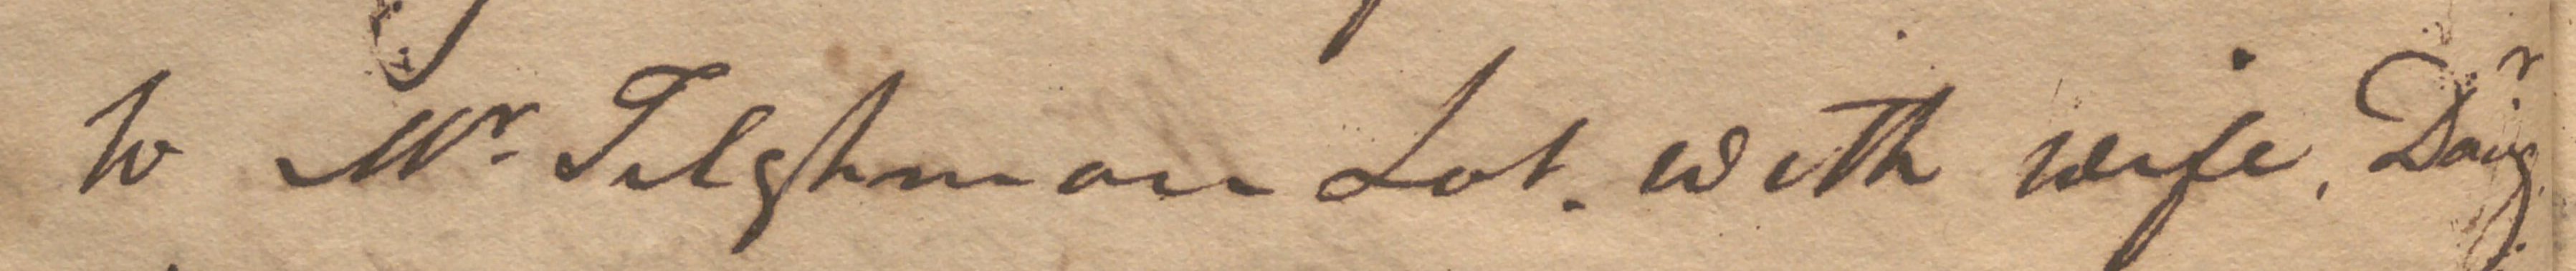to M^r. Tilghman Lot. with wife Daug^r.
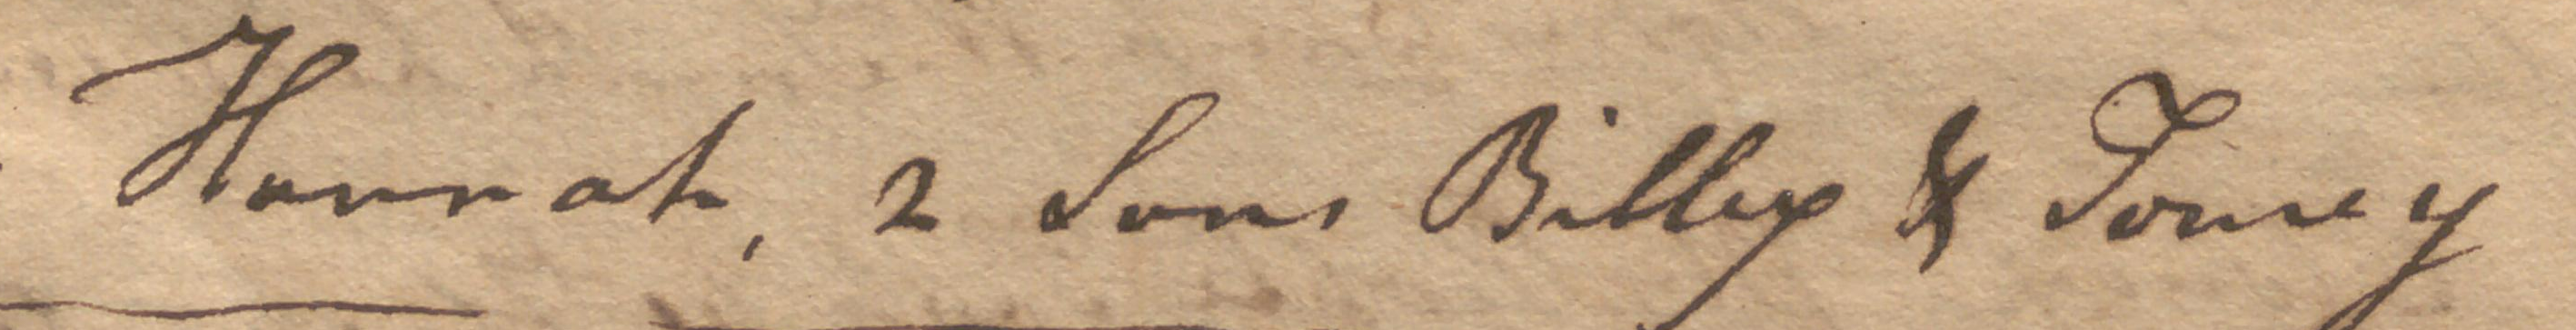Hannah, 2 Sons Billy & Tonrey
